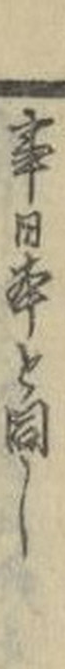事日本と同し
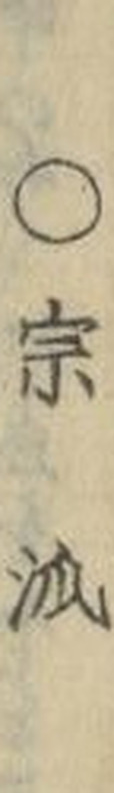○宗派
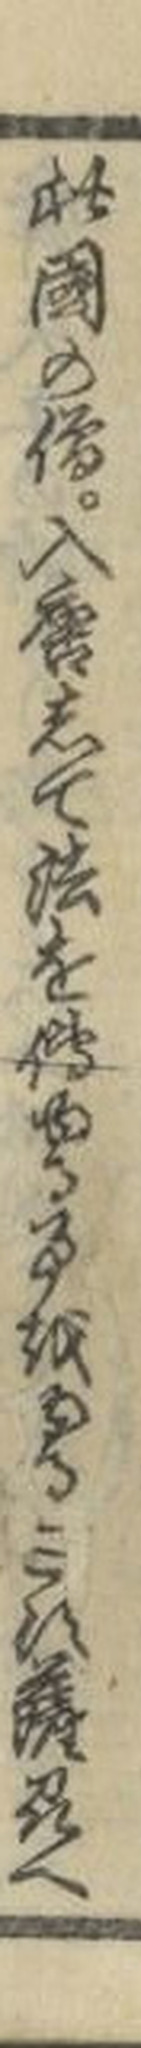此国の僧。入唐して法を伝ゆる事をゆるさす薩州へ
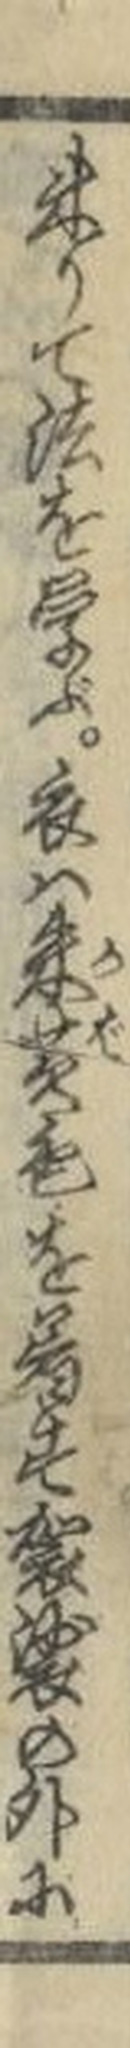来りて法を学ぶ。衣は朱黄色を着す袈裟の外に
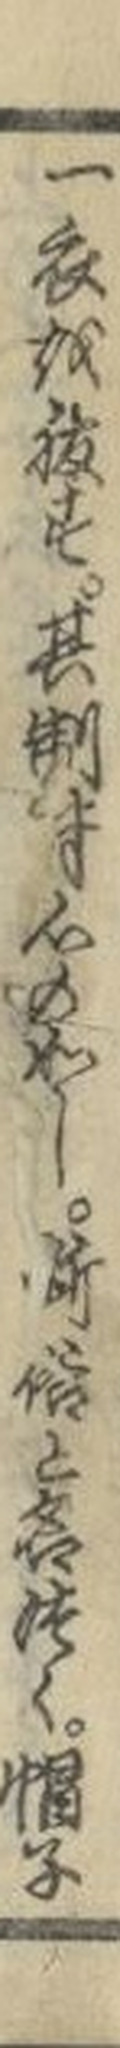一衣を袚す。其制背心の如し。断俗と名つく。帽子
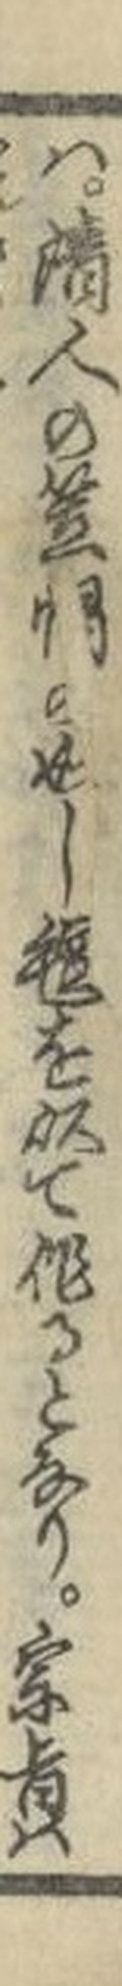は。清人の笠帽の如し氊を以て作るとなり。宗旨は
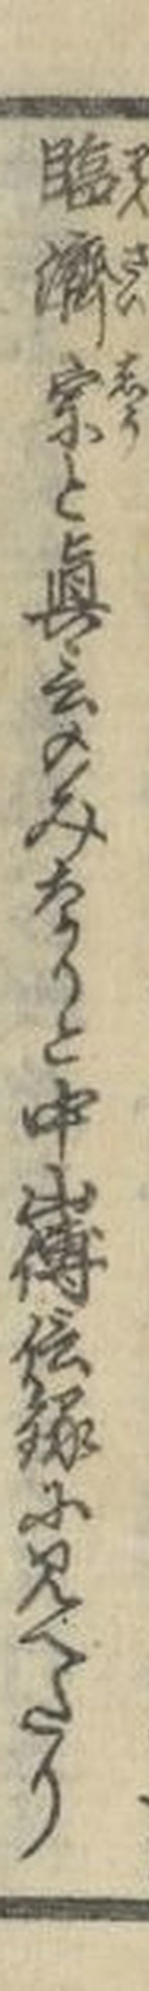臨済宗と真言のみなりと中山伝信録に見へたり
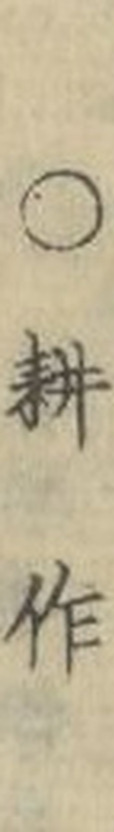○耕作
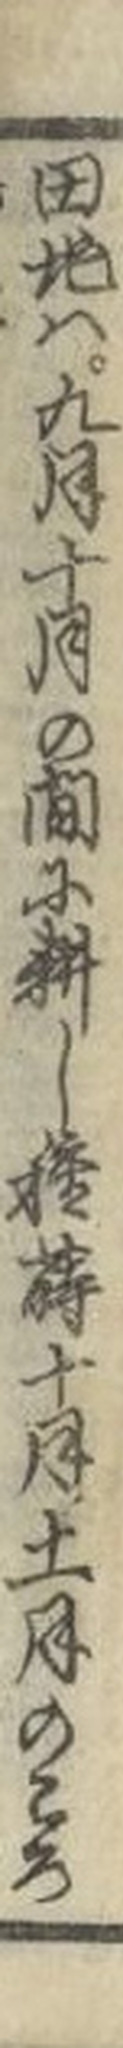田地は。九月十月の間に耕し種蒔十月十一月のころ
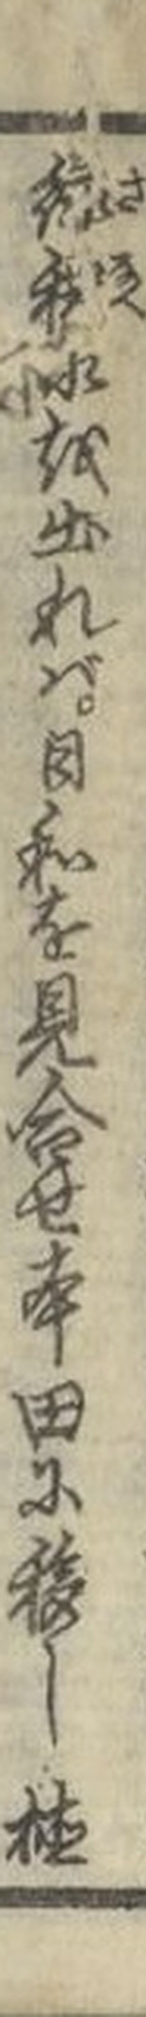緑穂水を出れば。日和を見合せ本田に移し植
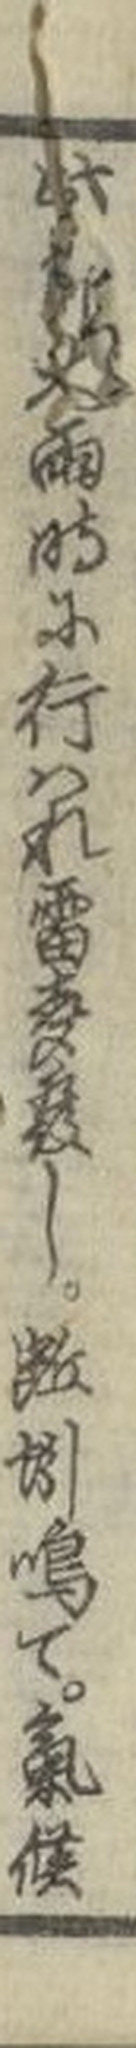此雨時に行はれ雷声発し。蚯蚓鳴て。気候
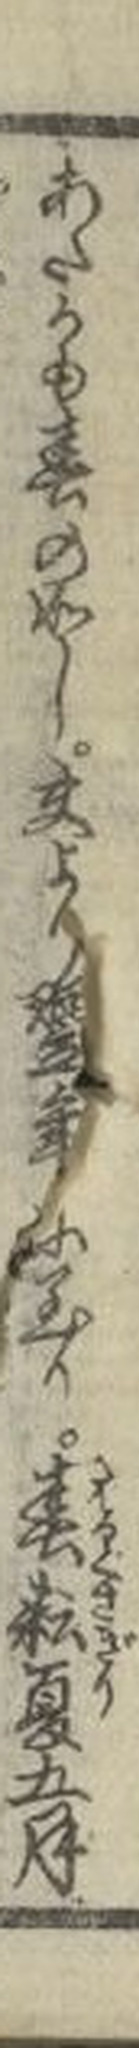あたかも春の如し。夫より翌年に至り。春耘夏五月
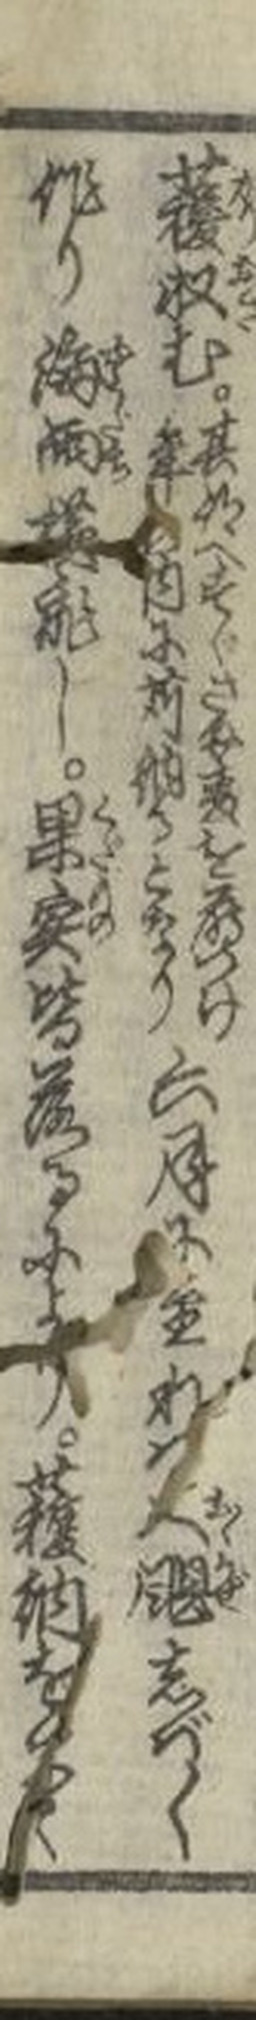作り海雨し。果実皆落るにより。穫納を

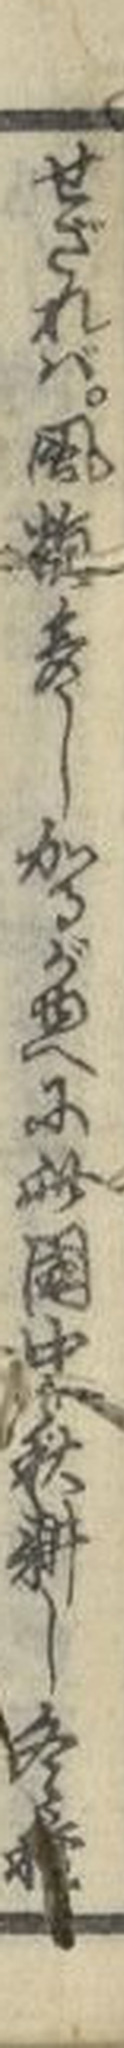せざれば。風頗多しかるがゆへに此国中秋耕し冬種
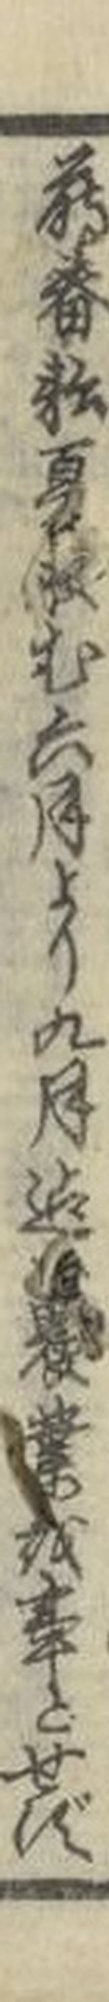蒔春耘夏む六月より九月迠農業を事とせず
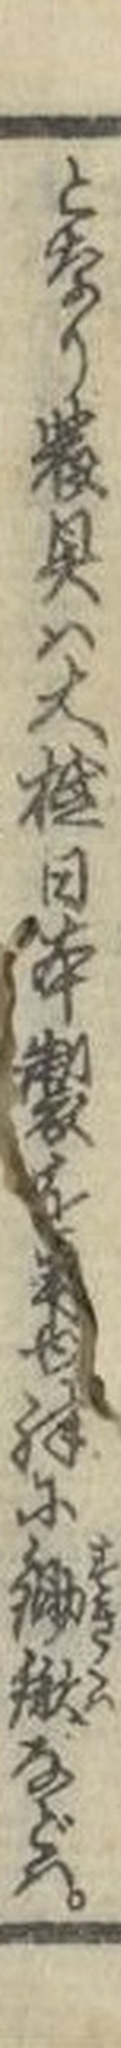となり農具は大抵日本製を用ゆ殊に鋤鍬などは。
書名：琉球解語
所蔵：University of the Ryukyus Library
